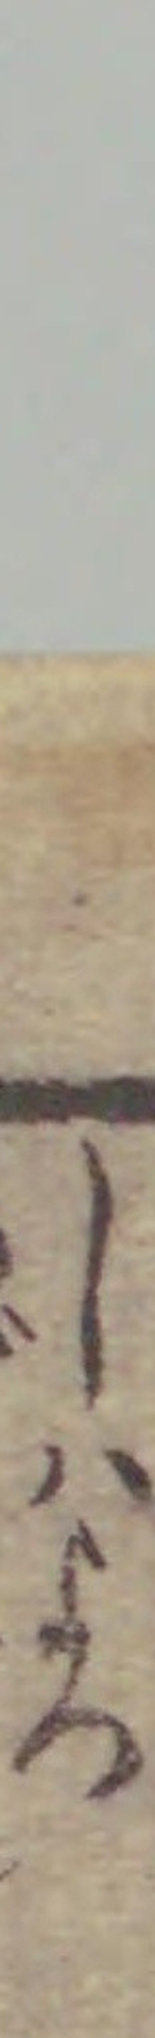しはよつ
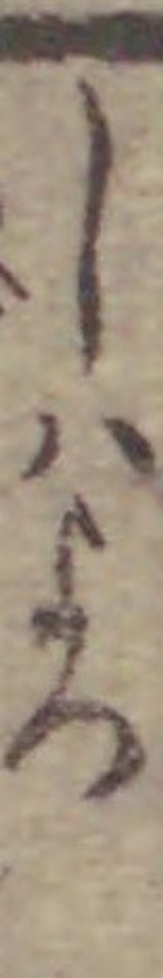しはよつ
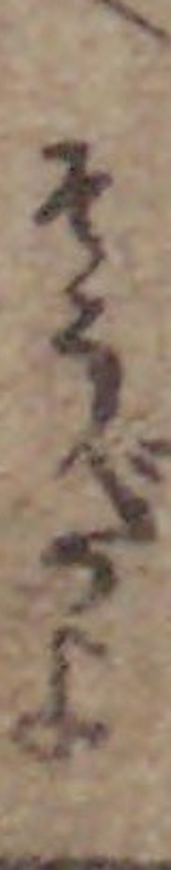そうだよ
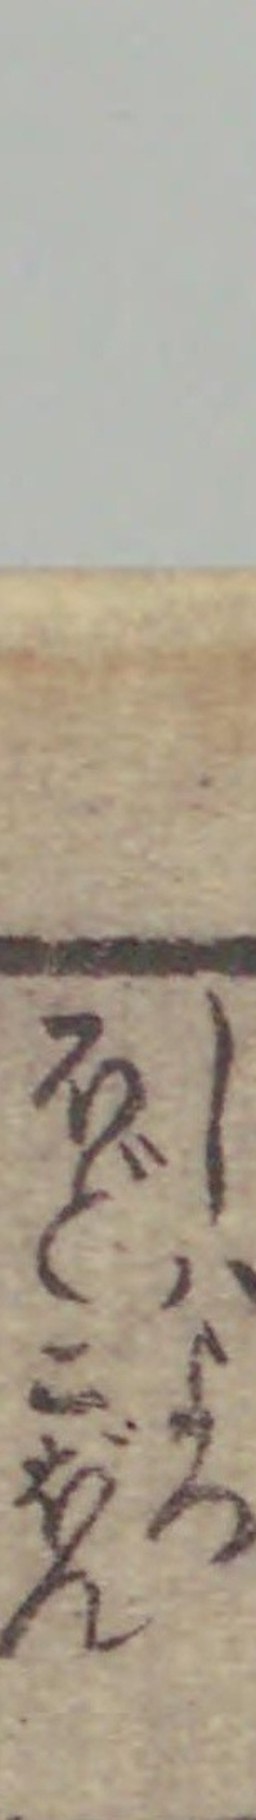ほどこぼん
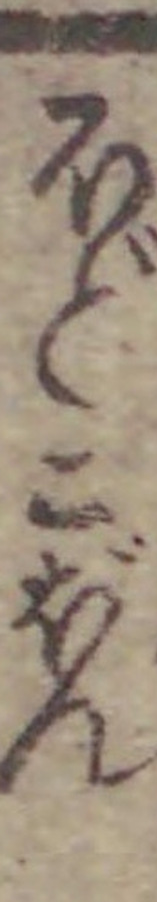ほどこぼん
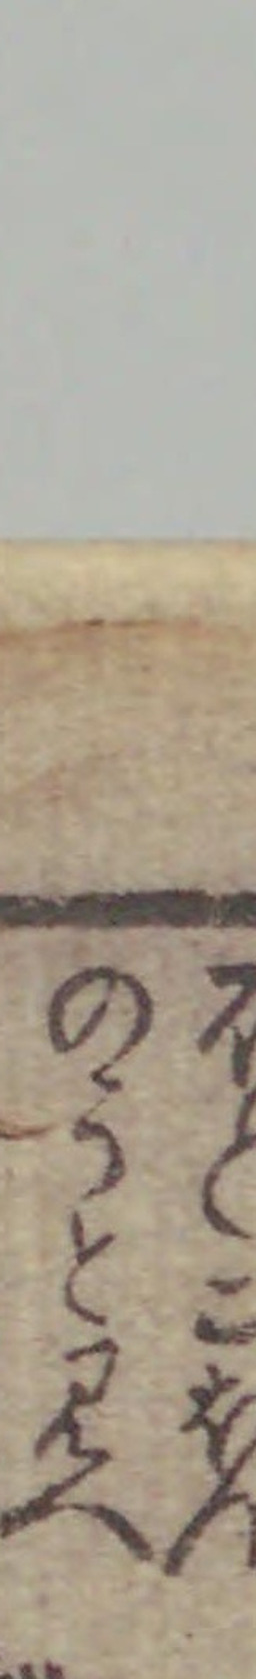のうと見へ
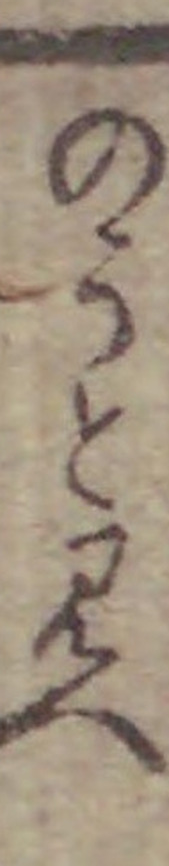のうと見へ
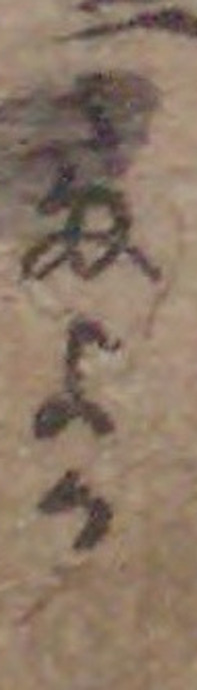さまよか
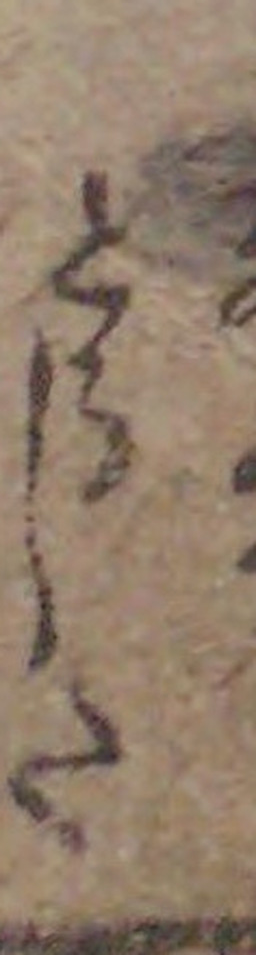とうした

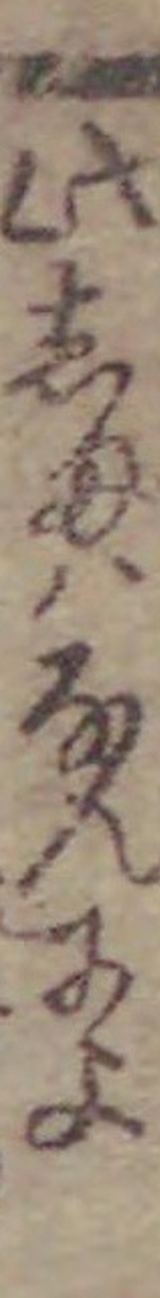此しまはなんによ
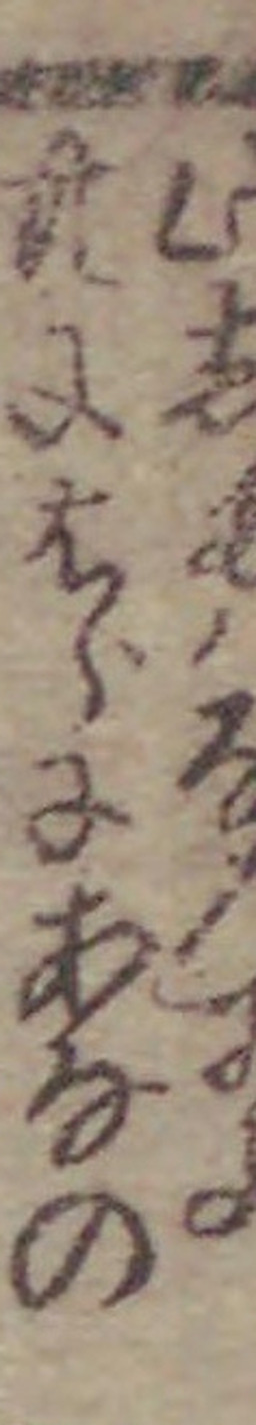共にはらにあなの
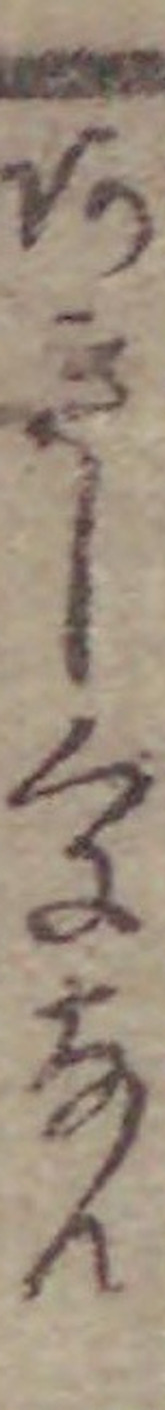あきしくになん
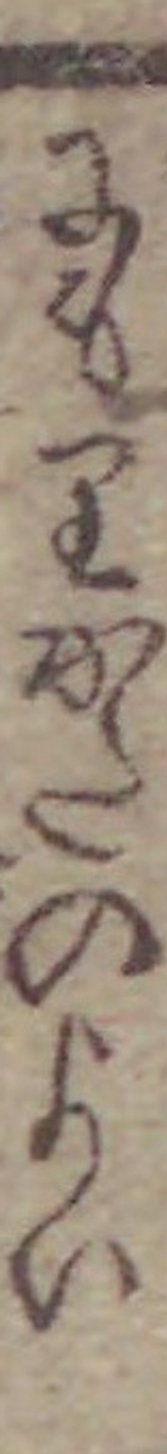にもりかたのよい
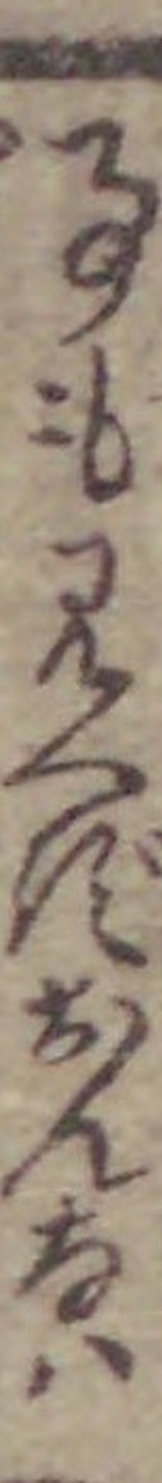事も見へずおんなは
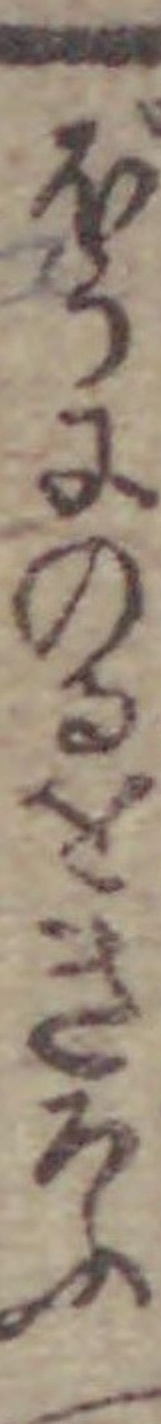ぼうにのるをきろふ
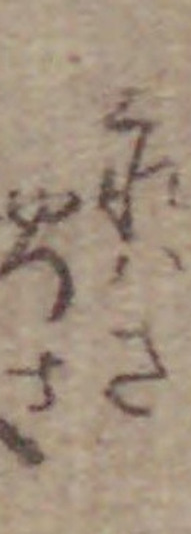これはさ
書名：近頃嶋めぐり 3巻
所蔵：国立国会図書館 National Diet Library, JAPAN
